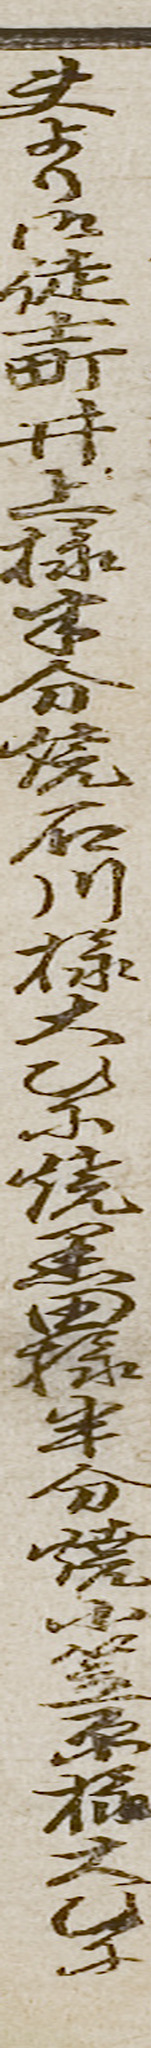夫より御徒士町井上様半分焼石川様大ひに焼黒田様半分焼小笠原様大ひに
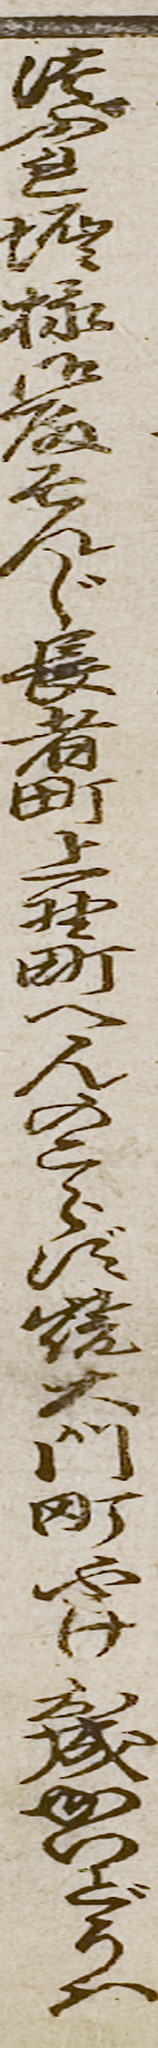つぶれ堀様御殿そんじ長者町上野町へんのこらず焼大門町やけお城かいどうハ
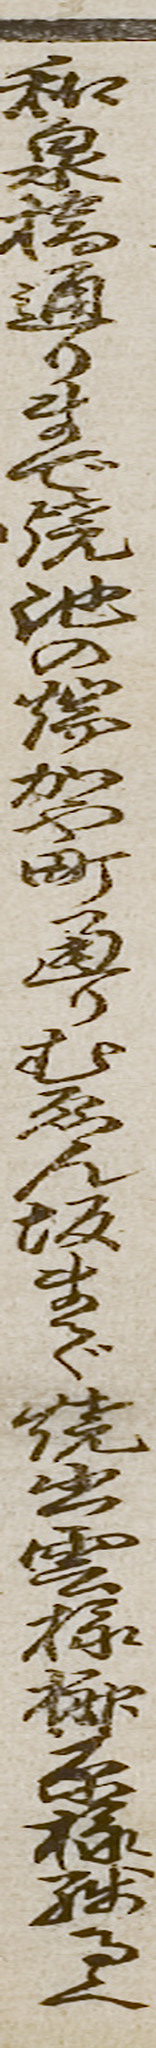和泉橋通りまで焼池の端かや待ち町通りむゑん坂まで焼出雲様榊原様残る也
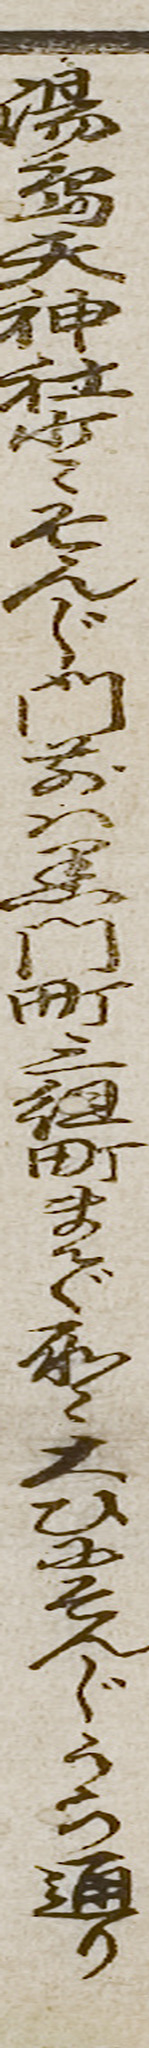湯島天神社少々そんじ門前ハ黒門町三組町まで所々大ひにそんじうら通り
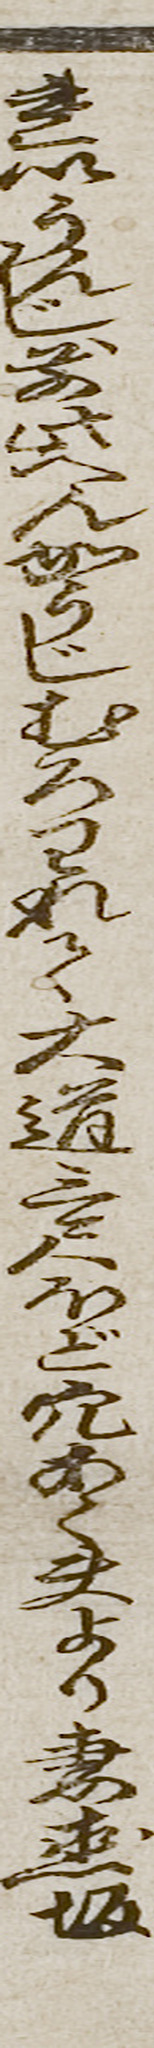れいがんじ前此へんかうじむろわれて大道三尺ほど穴あく夫より妻恋坂
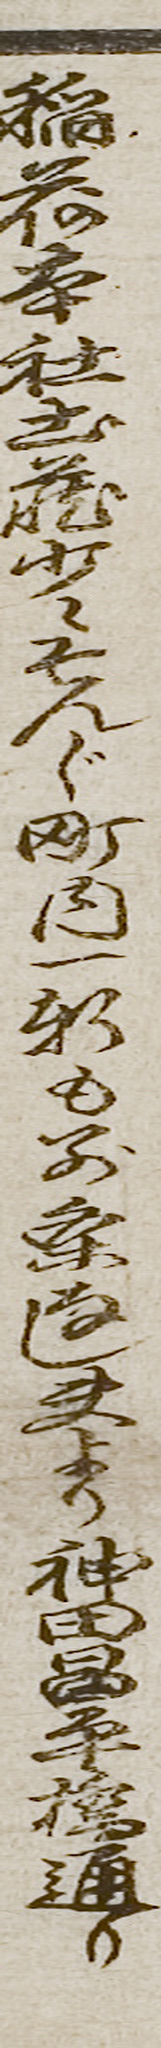稲荷本社土蔵少々そんじ町内一軒も別条なし夫より神田昌平橋通り
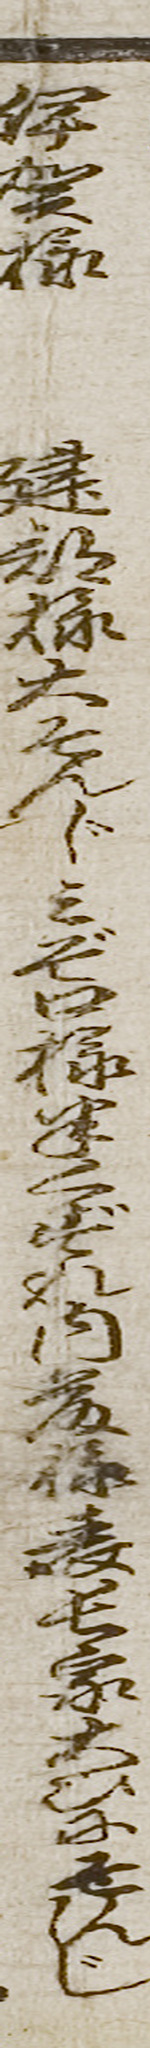伊賀様建部様大そんじみぞ口様半くずれ内藤様表長家大ひにそんじ
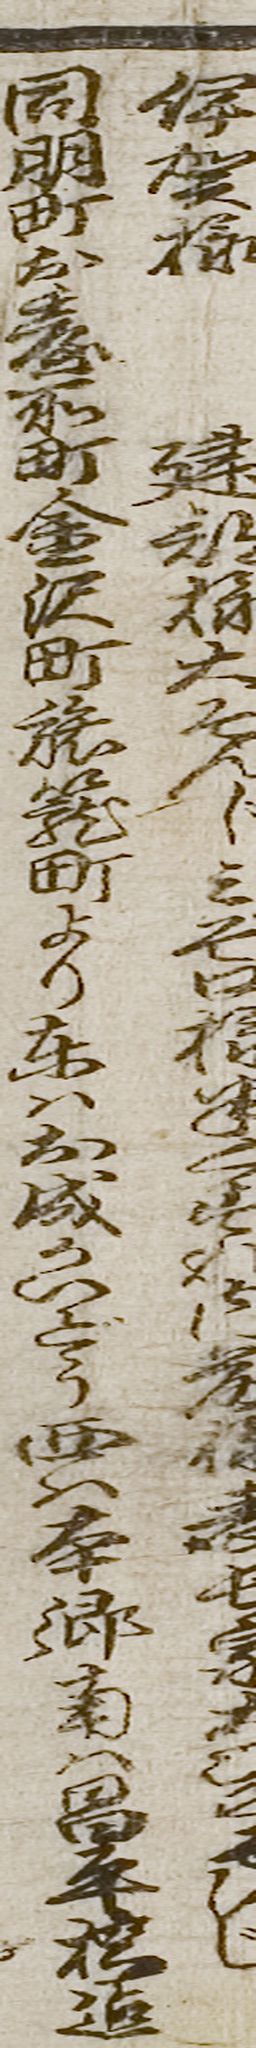同朋町お台所町金沢町旅籠町より東ハお成かいどう西ハ本郷南ハ昌平橋迄
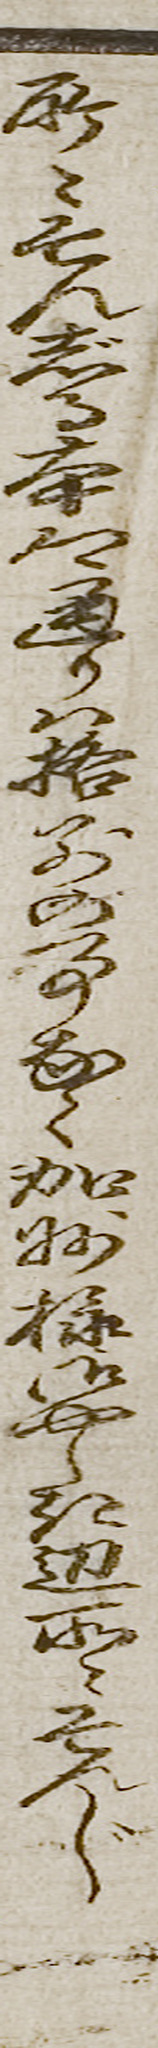所々そんじる本郷通りハ格別の事なく加州様御やしき辺所々そんじ
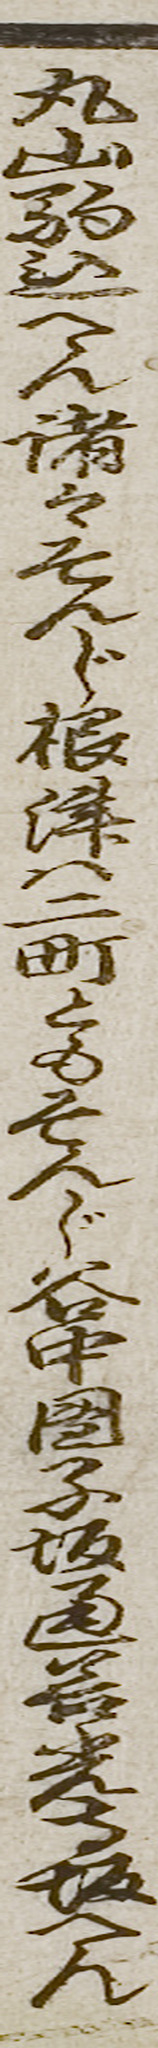丸山駒込へん諸々そんじ根津ハ二町ともそんじ谷中団子坂通善光寺坂へん
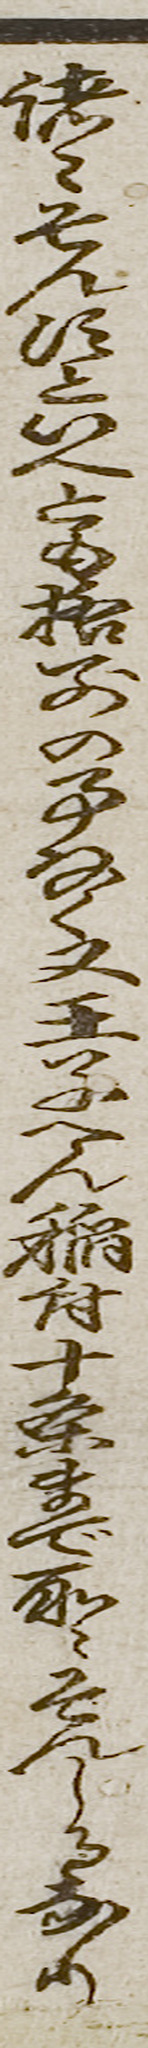諸々そんすといへとも格別の事なく又王子へん稲付十条まで所々そんしるなり
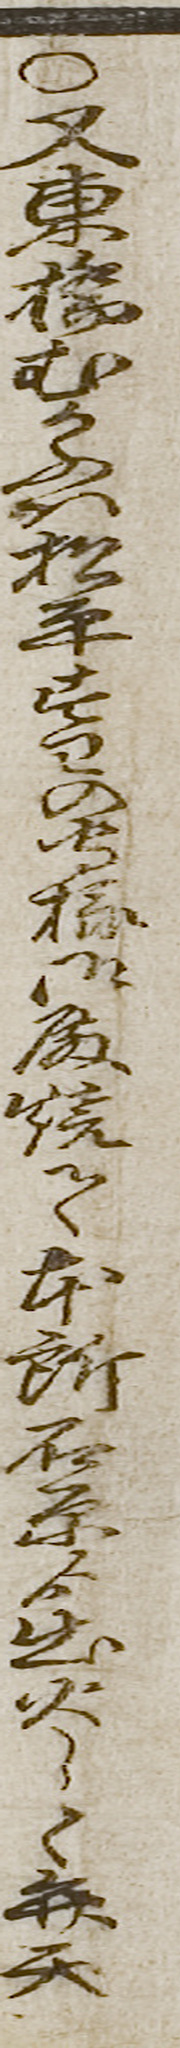○又東橋むかふハ松平すわの守様御殿焼て本所石原より出火して弁天
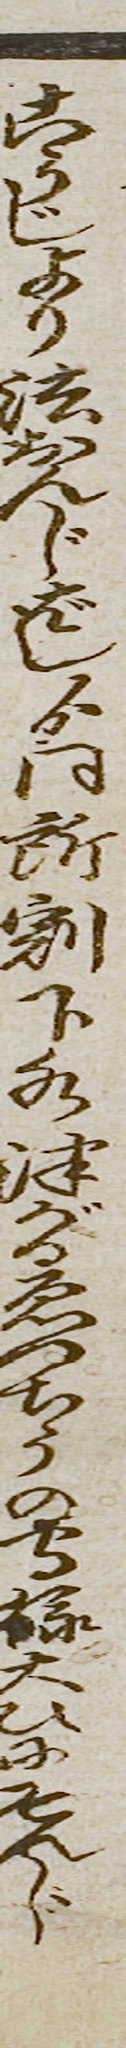こうじより法おんじばしより同所割下水津がるゑつちうの守様大ひにそんじ
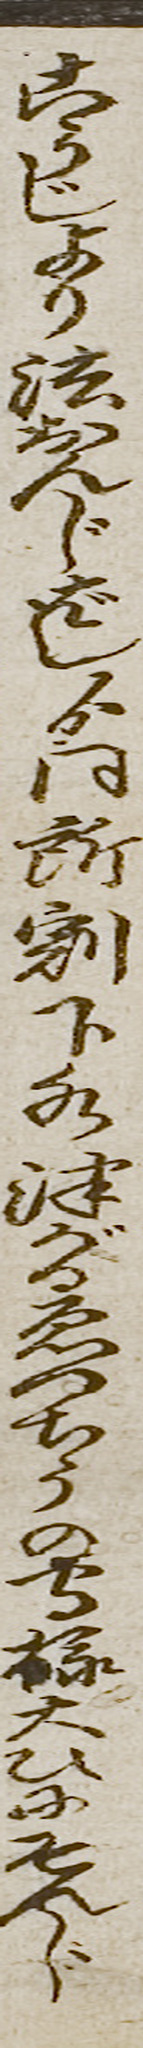こうじより法おんじばしより同所割下水津がるゑつちうの守様大ひにそんじ
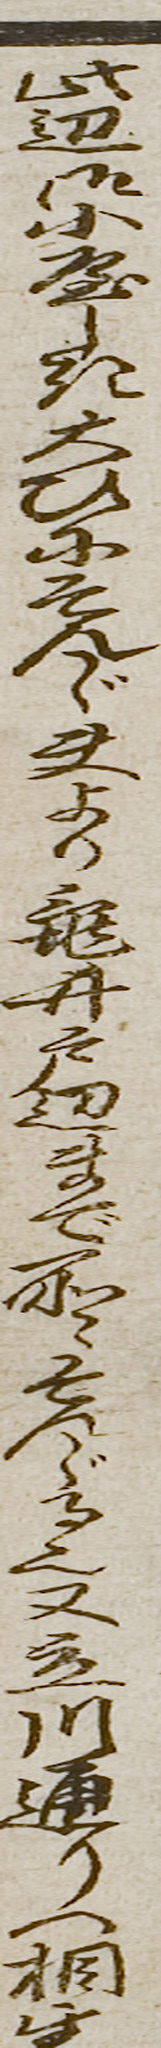此辺御小屋しき大ひにそんじ夫より亀井戸辺まで所々そんじる也又立川通りへ相生町
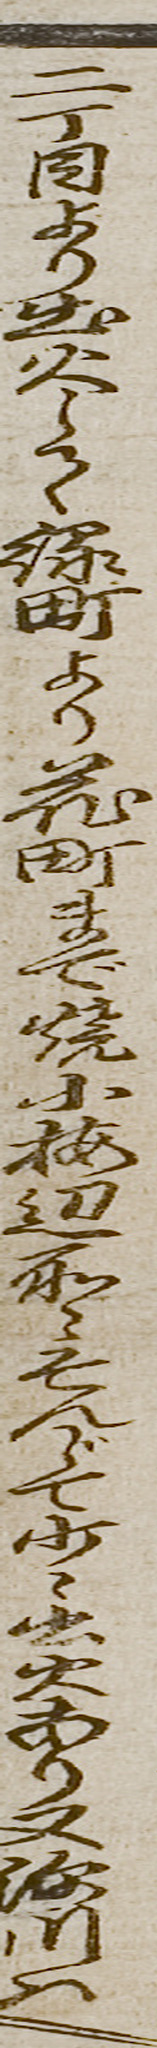二丁目より出火して緑町より花町まで焼小梅辺所々そんじて少々出火あり又深川ハ
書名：江戸大地震出火場所分
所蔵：東京大学総合図書館 General Library in the University of Tokyo, JAPAN
